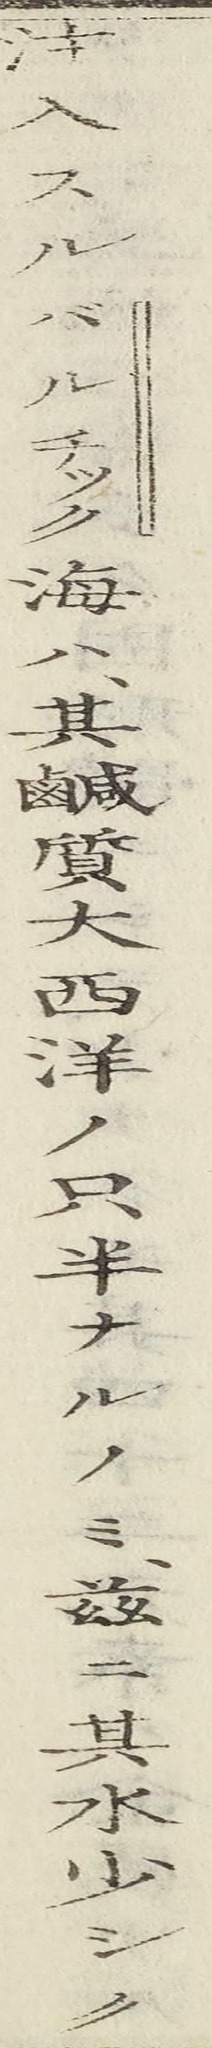注入スルバルチック海ハ、其鹹質大西洋ノ只半ナルノミ、爰ニ其水少シク
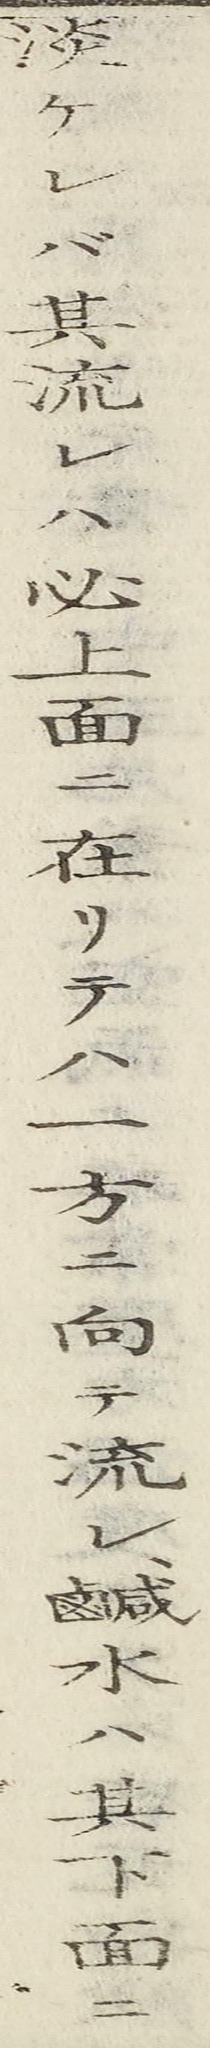淡ケレバ其流レハ必上面ニ在リテハ一方ニ向テ流レ、鹹水ハ其下面ニ
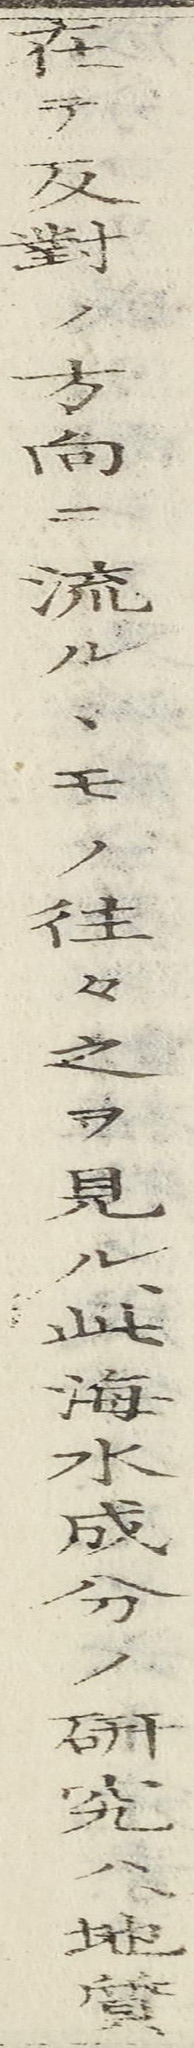在テ反対ノ方向ニ流ルヽモノ往々之ヲ見ル、此海水成分ノ研究ハ、地質
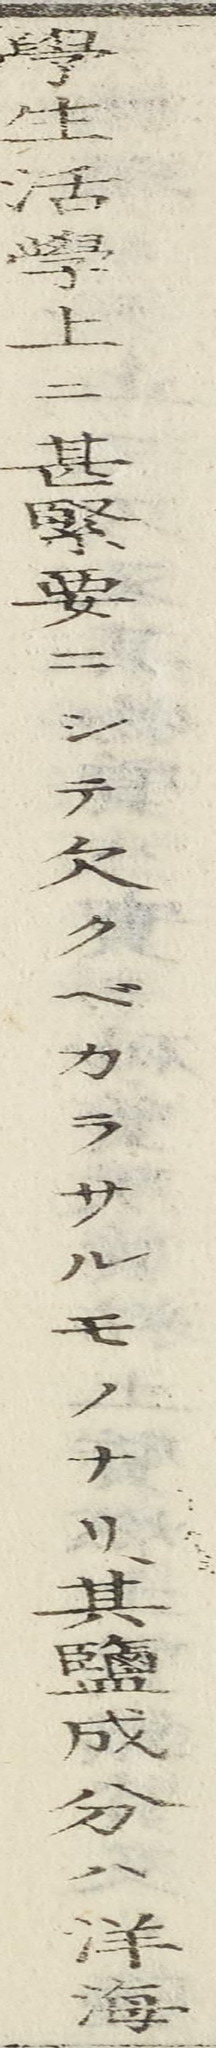学生活学上ニ甚緊要ニシテ欠クベカラサルモノナリ、其塩成分ハ洋海
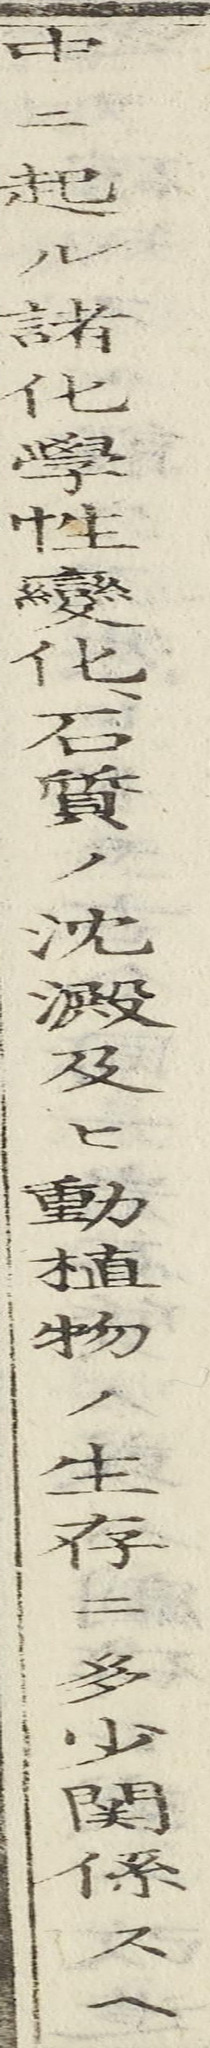中ニ起ル諸化学性変化、石質ノ沈殿及ヒ動植物ノ生存ニ多少関係スヘ
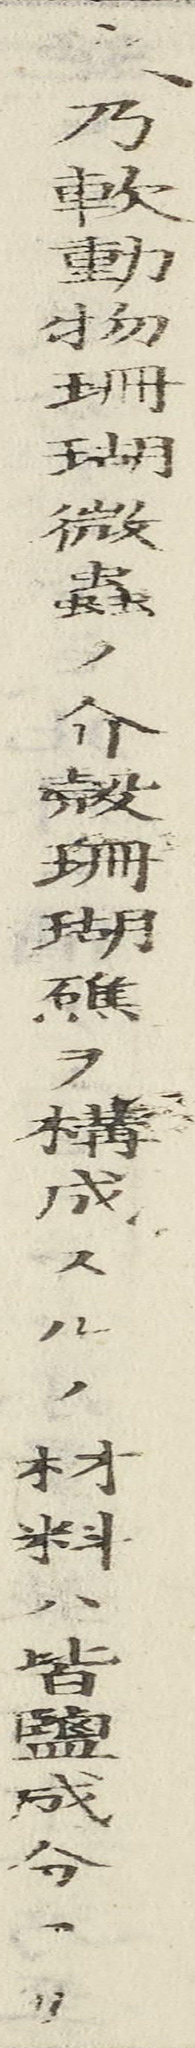キ、及軟動物珊瑚微虫ノ介殻珊瑚礁ヲ構成スルノ材料ハ皆塩成分ヨリ
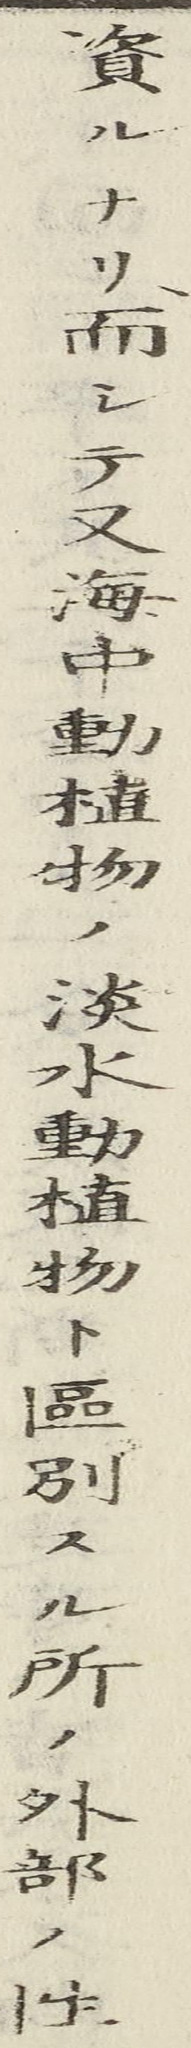資ルナリ、而シテ又海中動植物ノ淡水動植物ト区別スル所ノ外部ノ性
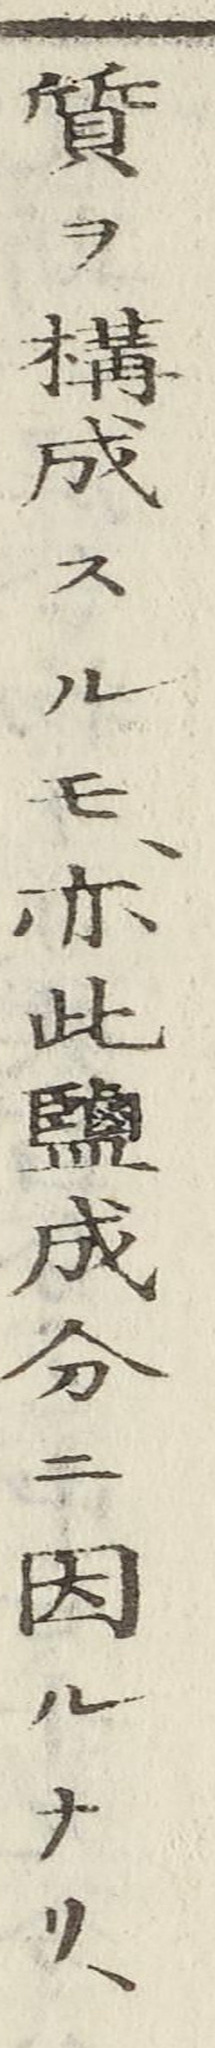質ヲ構成スルモ、亦此塩成分ニ因ルナリ、
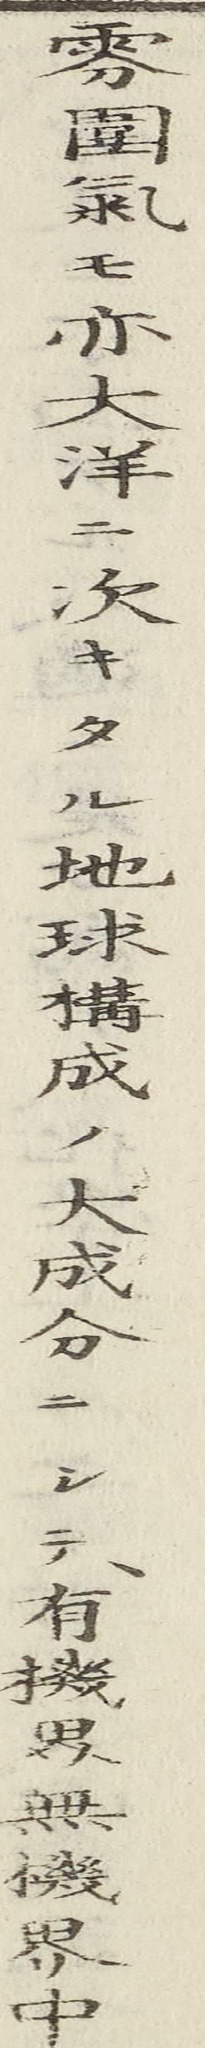雰囲気モ亦大洋ニ次キタル地球構成ノ大成分ニシテ、有機界無機界中
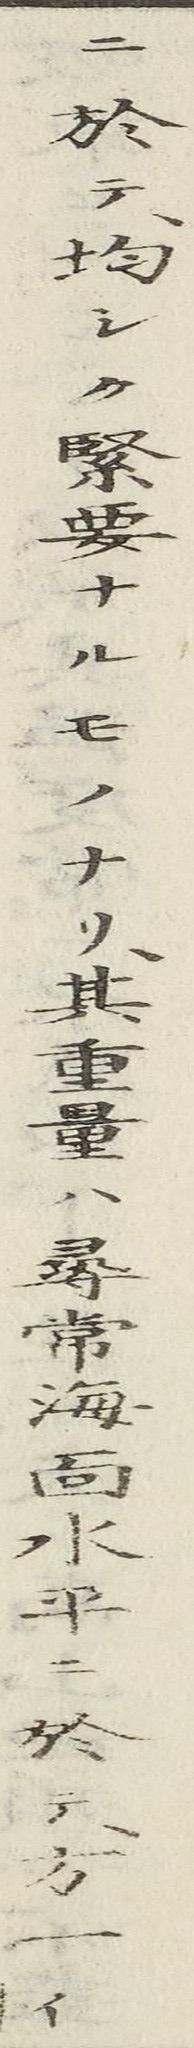ニ於テ、均シク緊要ナルモノナリ、其重量ハ尋常海面水平ニ於テ、方一イ
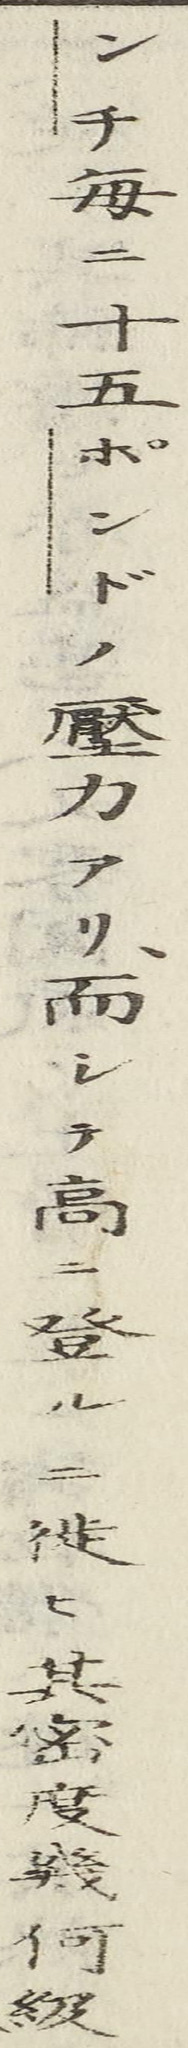ンチ毎ニ十五ポンドノ圧力アリ、而シテ高ニ登ルニ従ヒ其密度幾何級
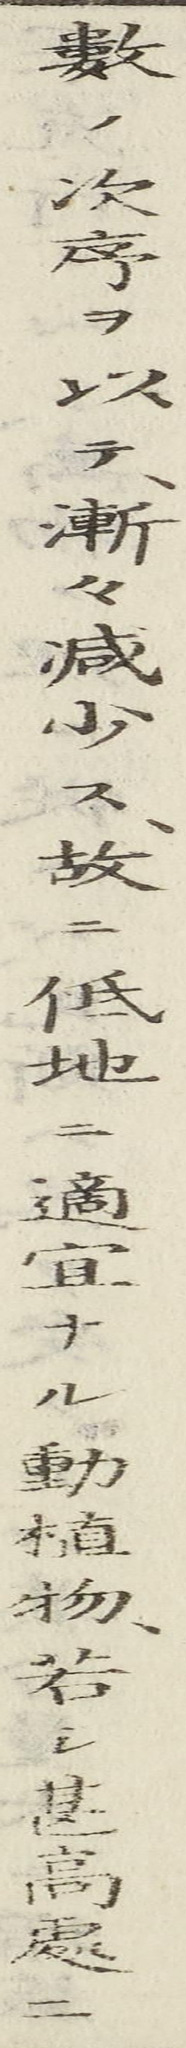数ノ次序ヲ以テ、漸々減少ス、故ニ低地ニ適宜ナル動植物、若シ甚高処ニ
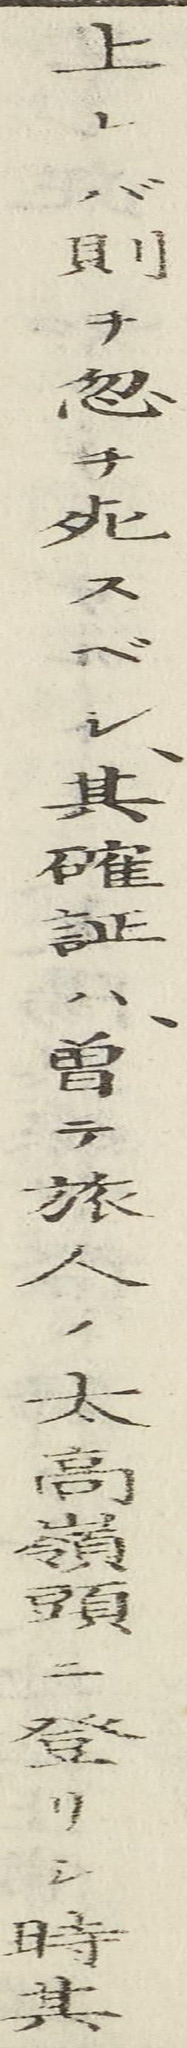上レバ則チ忽チ死スベシ、其確証ハ、曾テ旅人ノ太高嶺頭ニ登リシ時其
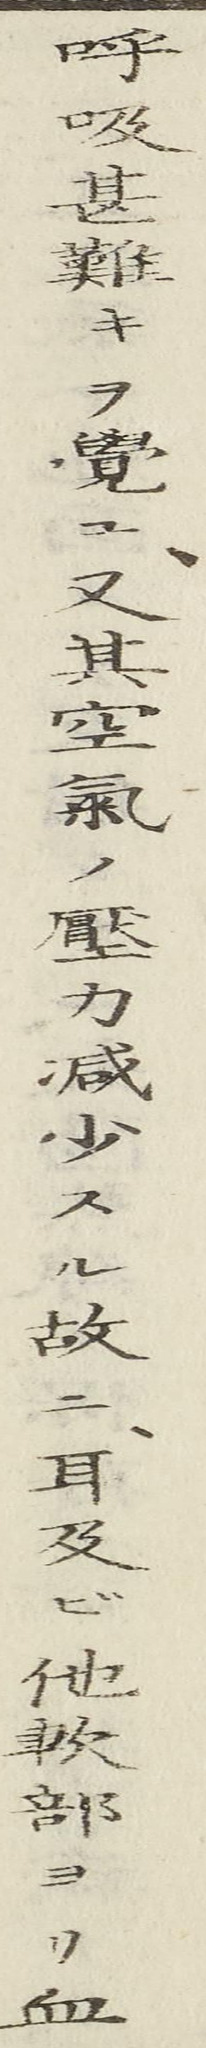呼吸甚難キヲ覚ユ、又其空気ノ圧力減少スル故ニ、耳及ビ他軟部ヨリ血
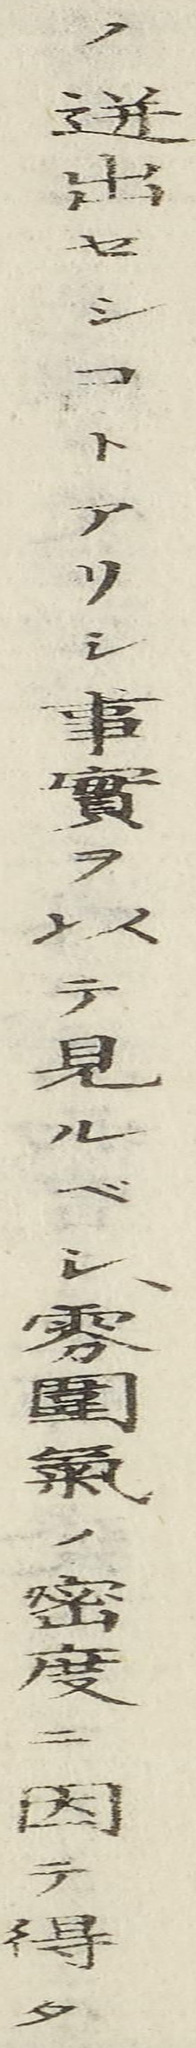ノ迸出セシコトアリシ事実ヲ以テ見ルベシ、雰囲気ノ密度ニ因テ得タ
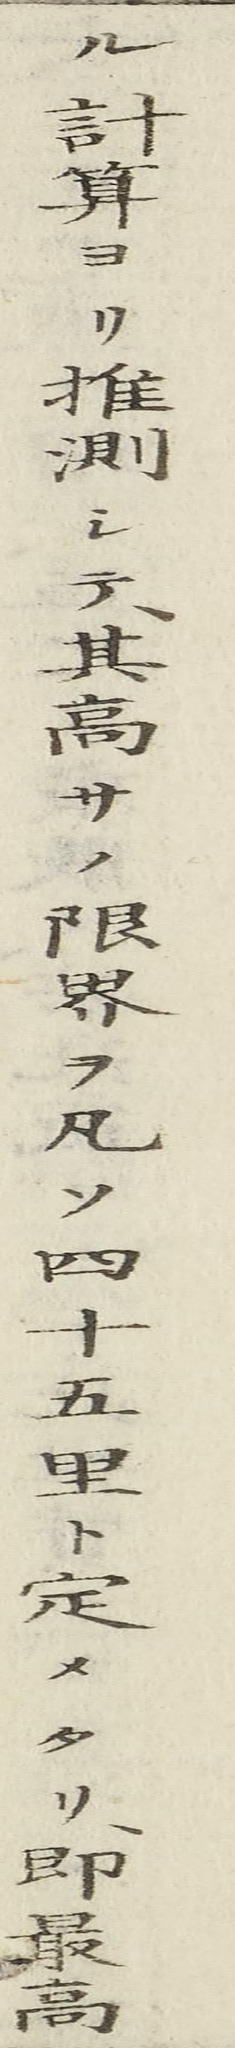ル計算ヨリ推測シテ、其高サノ限界ヲ凡ソ四十五里ト定メタリ、即最高
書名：百科全書　地文學　全
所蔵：東京大学地震研究所図書室 Earthquake Research Institute Library, The University of Tokyo, JAPAN
